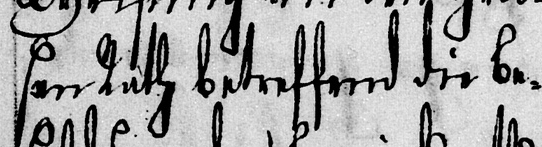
betreffend die
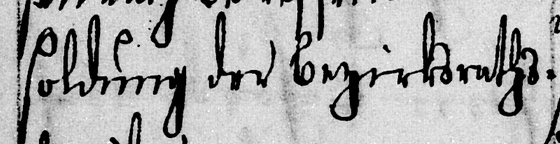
soldung der Bezirksraths¬
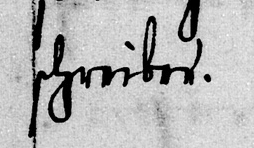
schreiber,
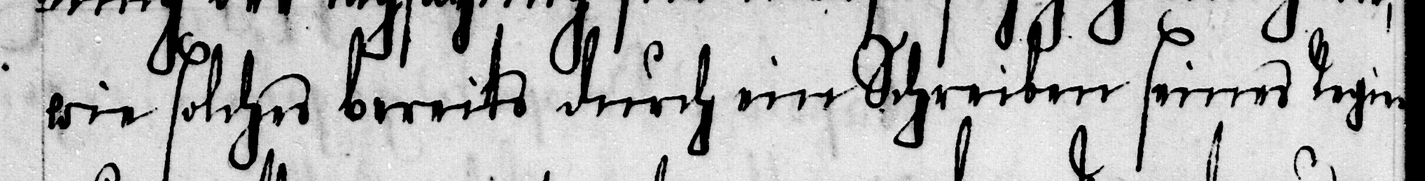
wie solches bereits durch ein Schreiben seines Regie¬
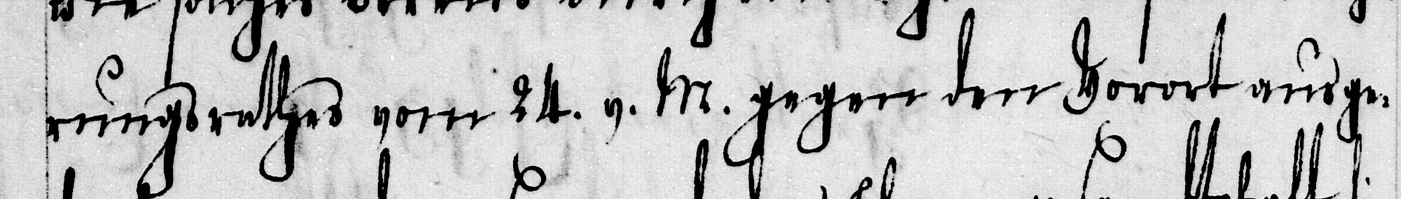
rungsrathes vom 24. v. M. gegen den Vorort ausge¬
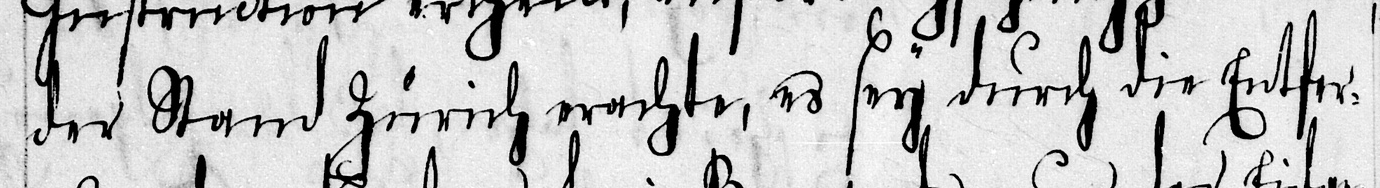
der Stand Zürich erachte, es sey durch die Entfer¬
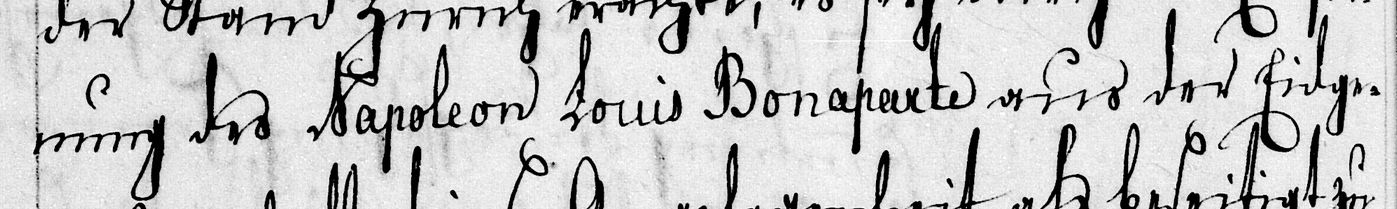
nung des Napoleon Louis Bonaparte aus der Eidge¬
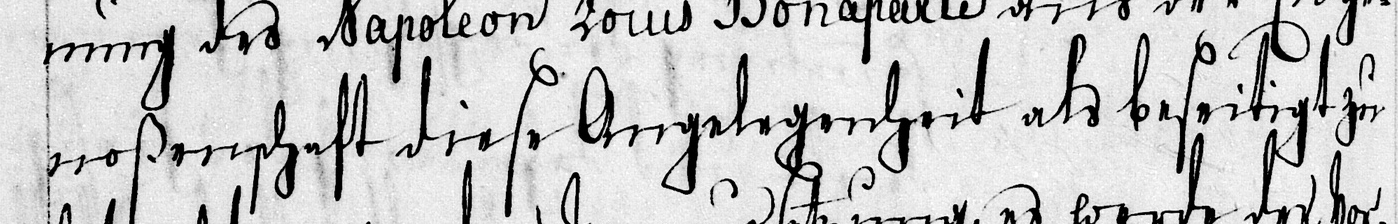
noßenschaft diese Angelegenheit als beseitigt zu
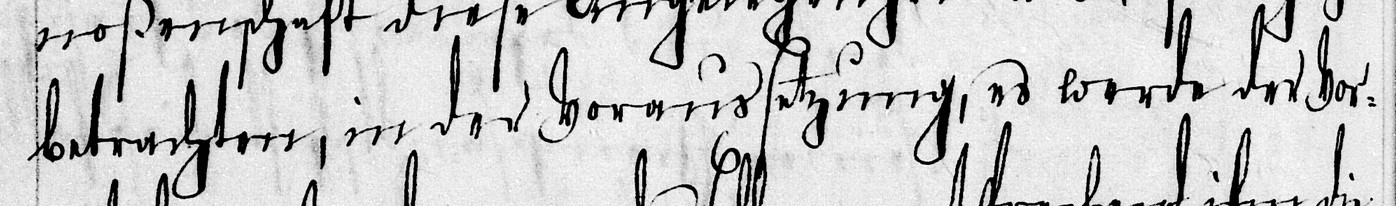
betrachten, in der Voraussetzung, es werde der Vor¬
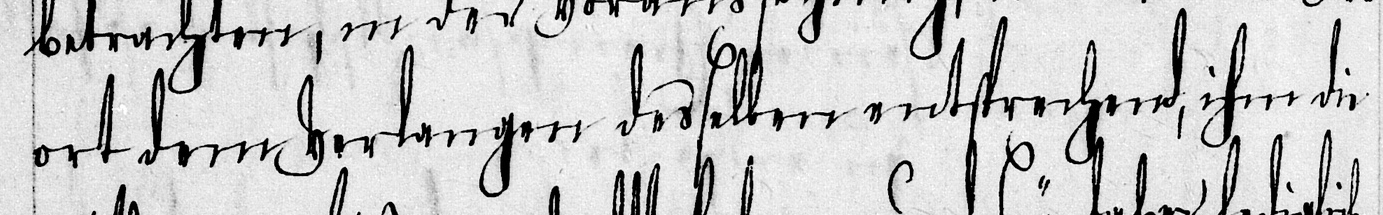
ort dem Verlangen desselben entsprechend,
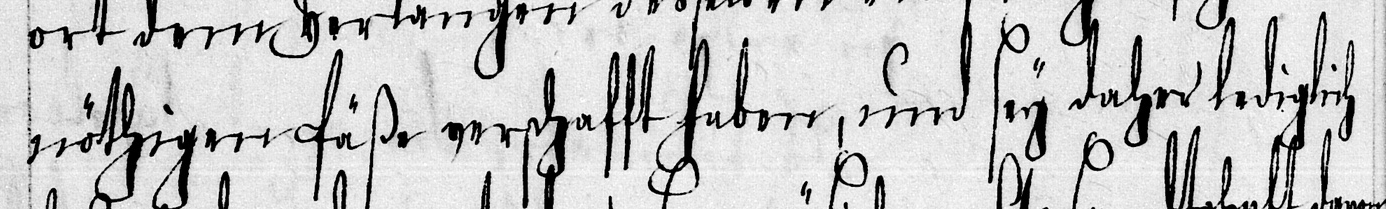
nöthigen Päße verschafft haben, und sey daher
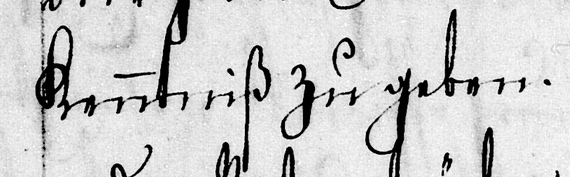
Kenntniß zu geben.
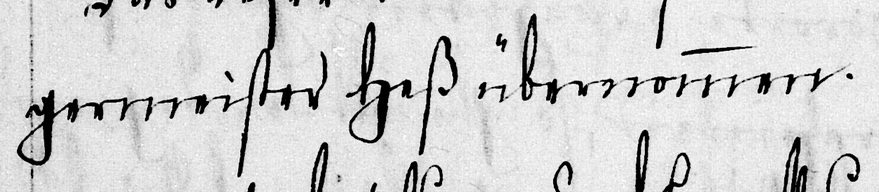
germeister Heß übernommen.
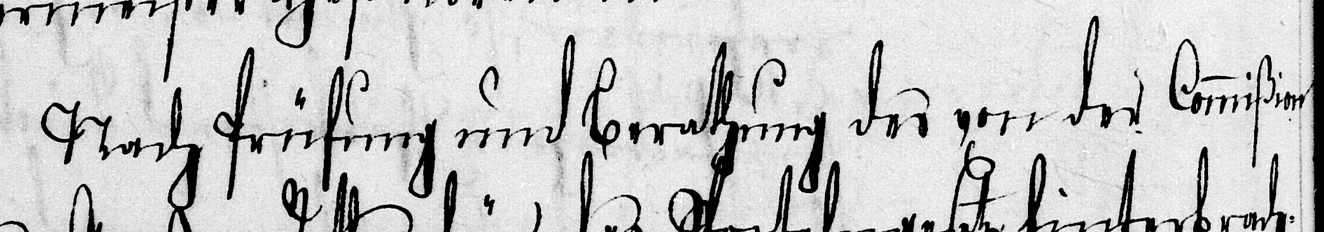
Nach Prüfung und Berathung des von der Commi¬
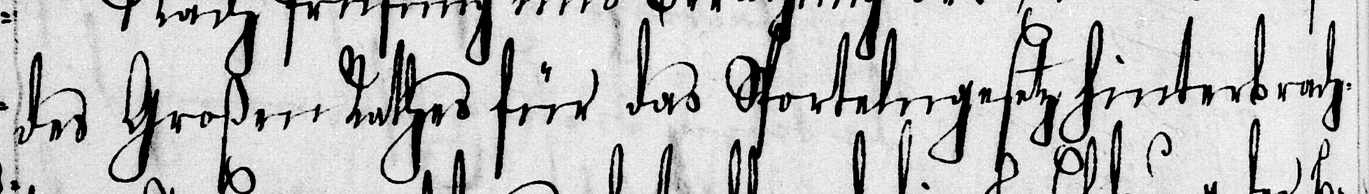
des Großen Rathes für das Sportelngesetz hinterbrac¬
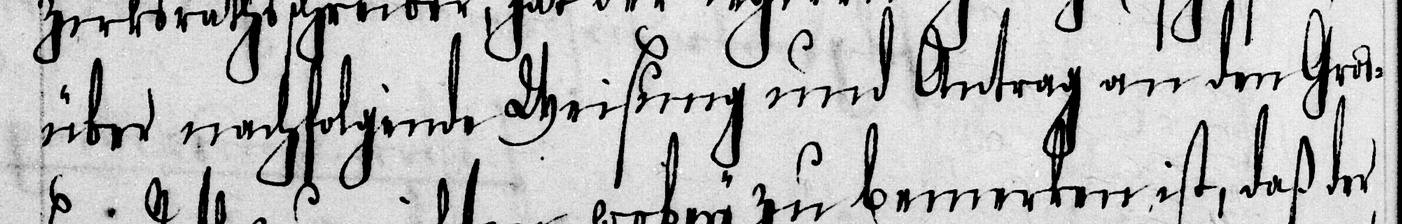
rüber nachfolgende Weisung und Antrag an den Gro¬
